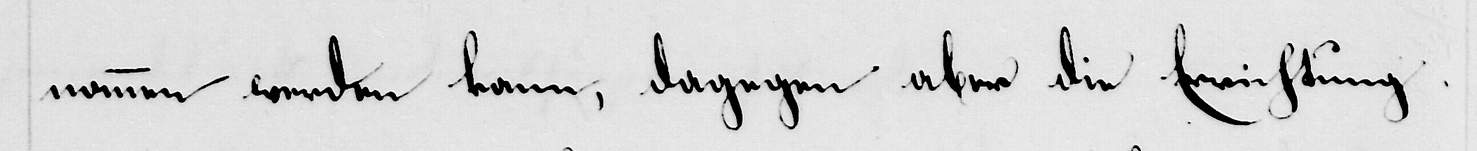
nommen werden kann, dagegen aber die Errichtung
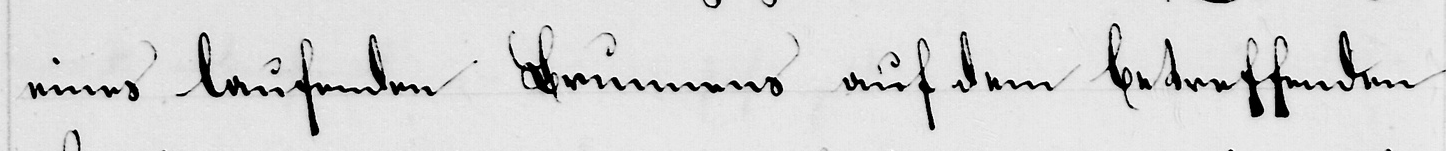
eines laufenden Brunnens auf dem betreffenden
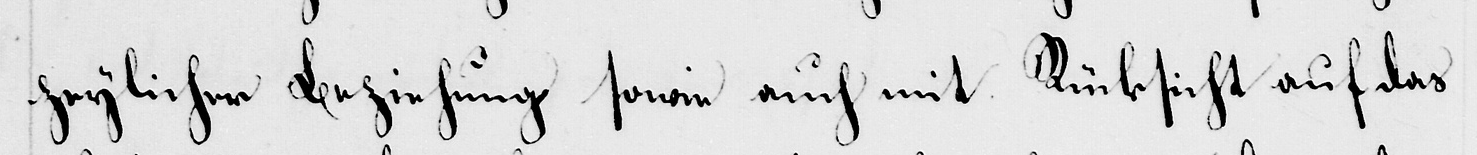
zeylicher Beziehung sowie auch mit Rücksicht auf das
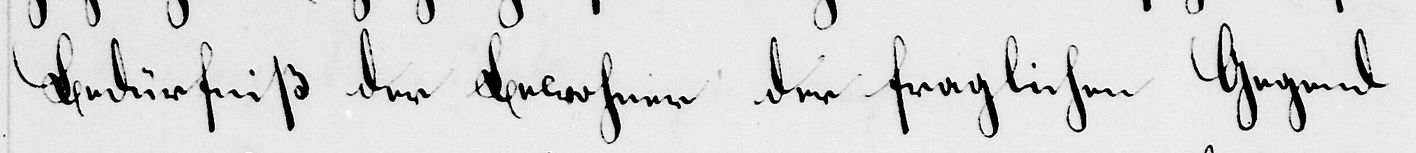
Bedürfniß der Bewohner der fraglichen Gegend
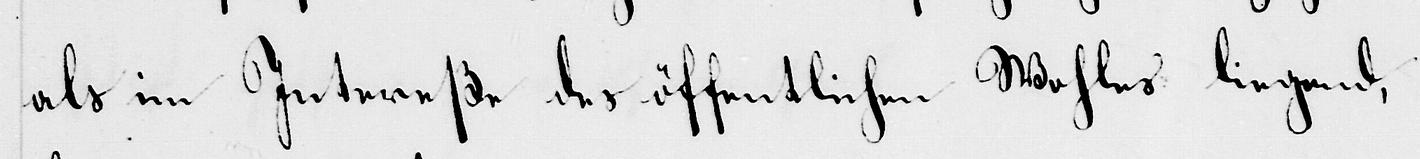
als im Intereße des öffentlichen Wohles liegend,
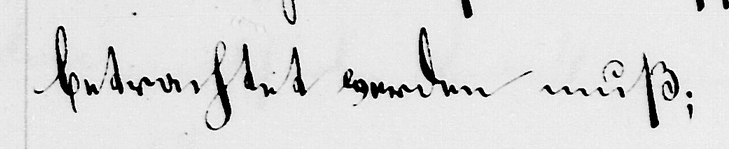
betrachtet werden muß:
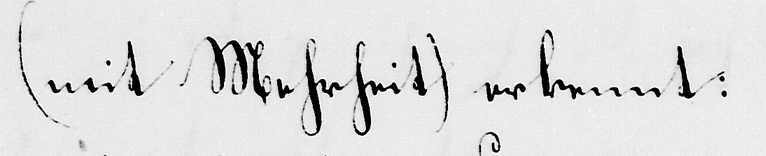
(mit Mehrheit) erkannt:
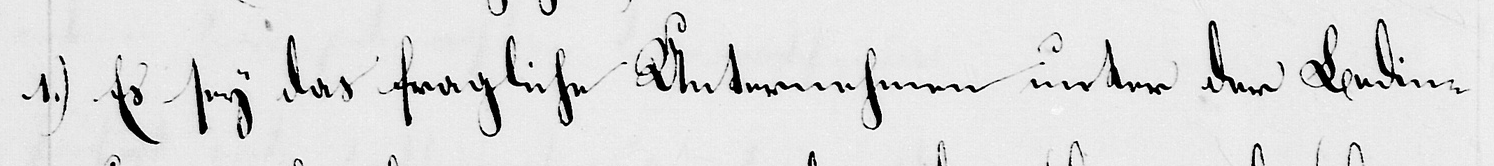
1.) Es sey das fragliche Unternehmen unter der Bedin¬
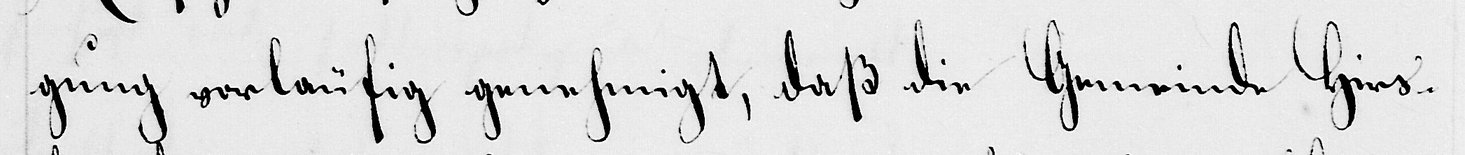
gung vorläufig genehmigt, daß die Gemeinde Hirs¬
